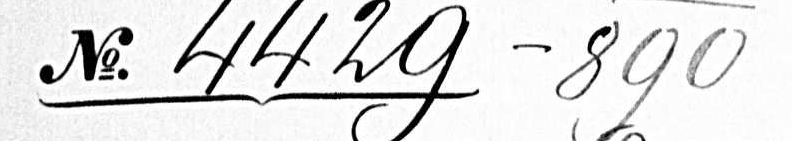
No. 4429 - 890
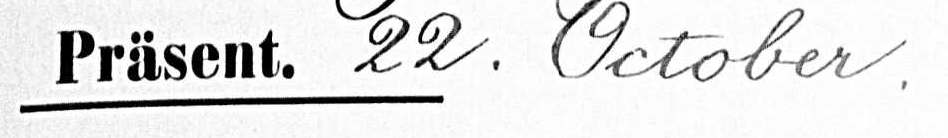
Präsent. 22.October.
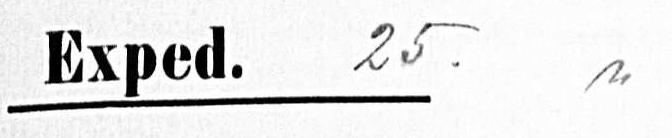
Exped. 25. October.
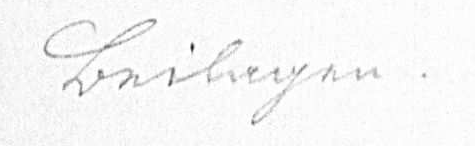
Beilagen.
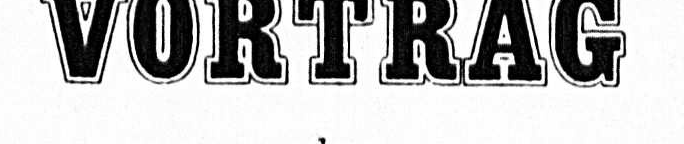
Vortrag
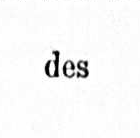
des
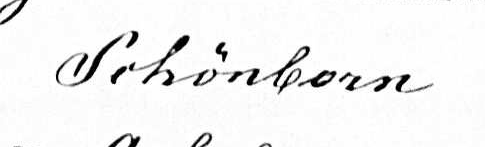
Schönborn
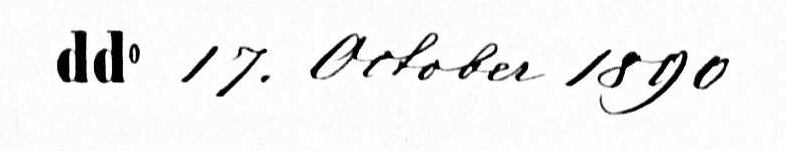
ddo 17. October 1890
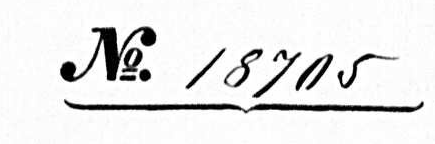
No. 18705
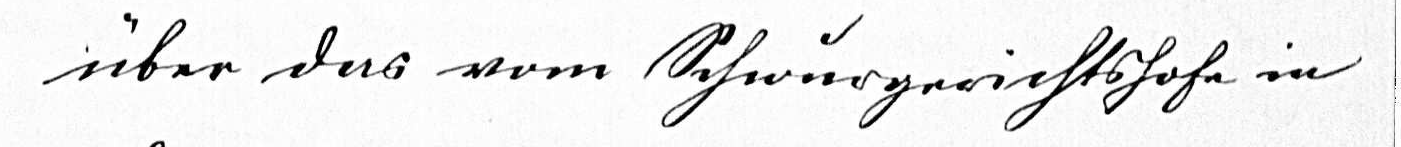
über das vom Schwurgerichtshofe in
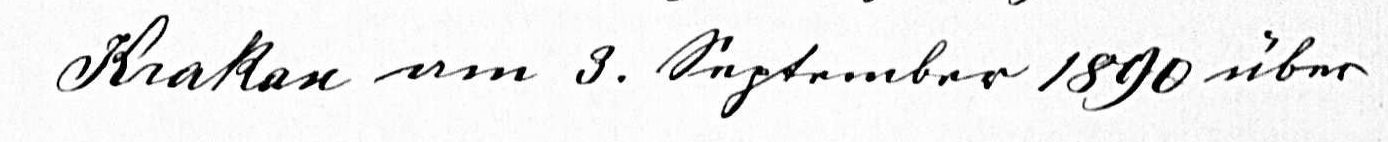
Krakan am 3. September 1890 über
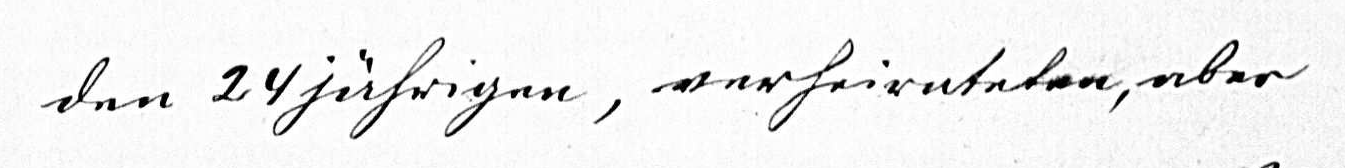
den 24jährigen, verheirateten, aber
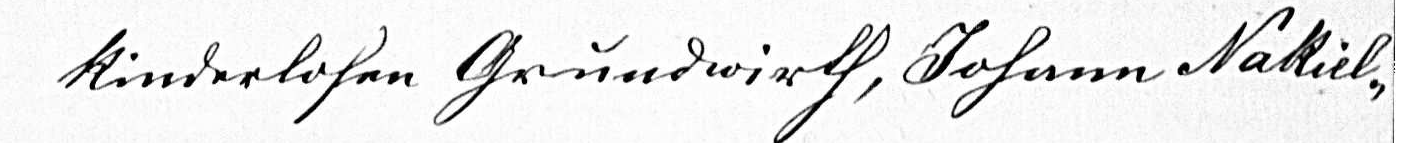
kinderlosen Grundwirth, Johann Nakiel¬
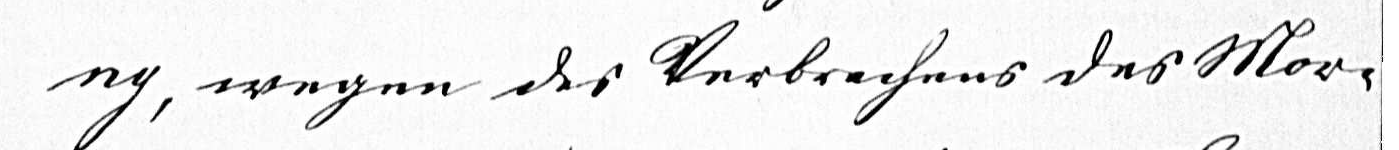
ny, wegen des Verbrechens des Mor¬
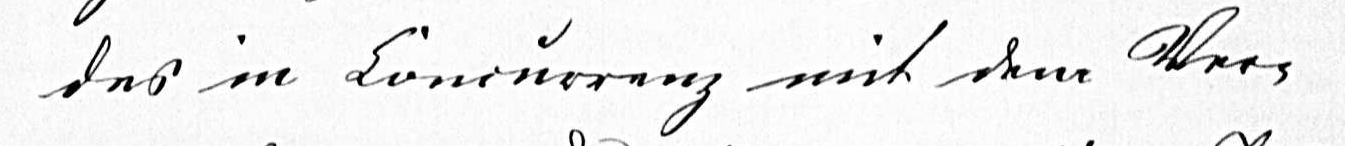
des in Concurrenz mit dem Ver¬
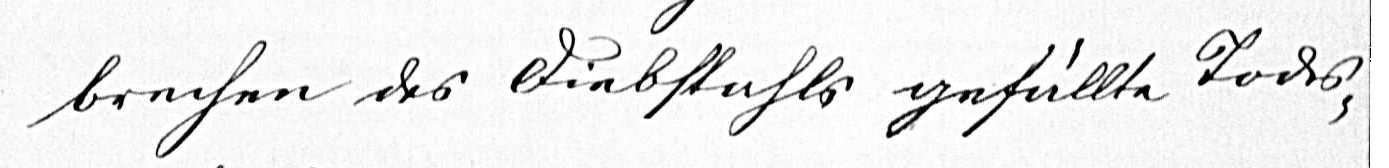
brechen des Diebstahls gefällte Todes¬
